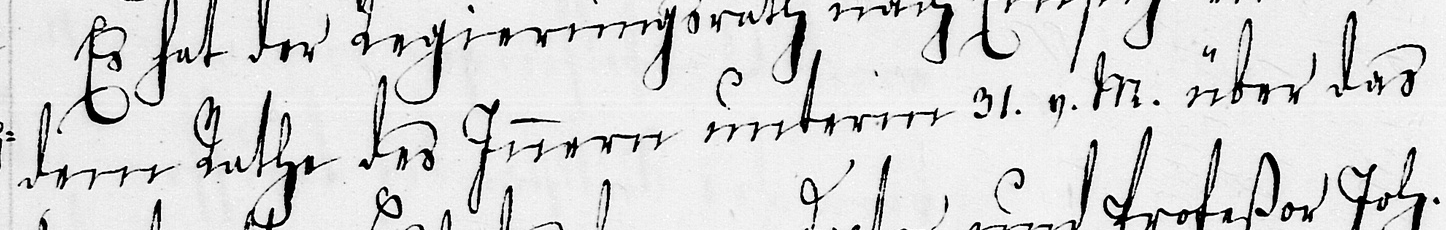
dem Rathe des Innern unterm 31. v. M. über das
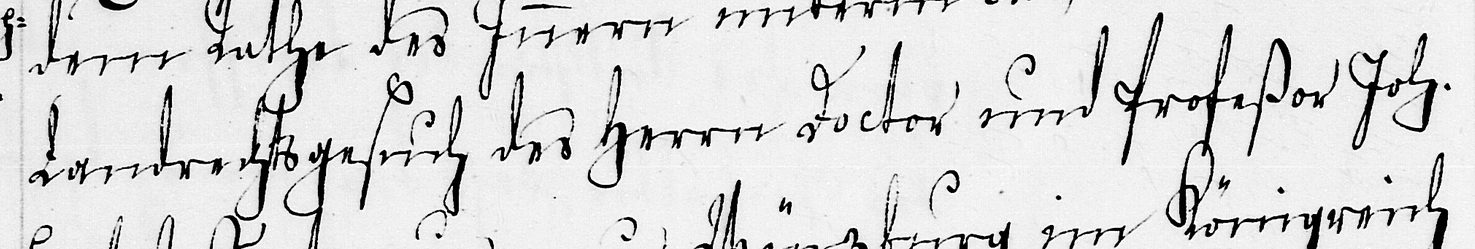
Landrechtsgesuch des Herrn Doctor und Profeßor Joh.
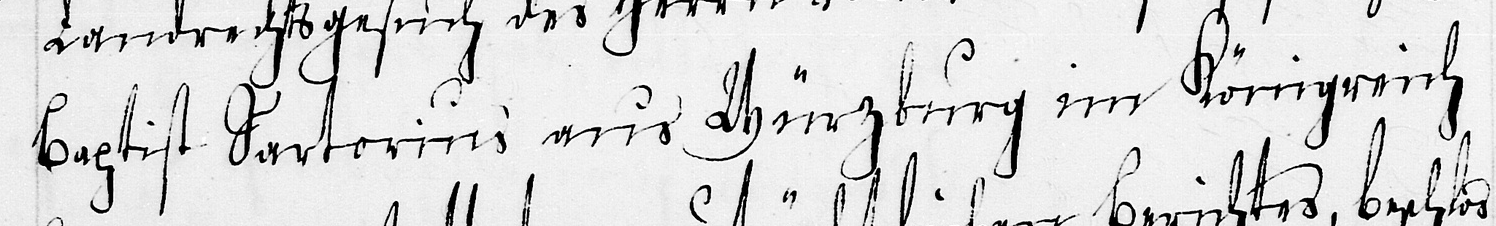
Baptist Sartorius aus Würzburg im Königreich
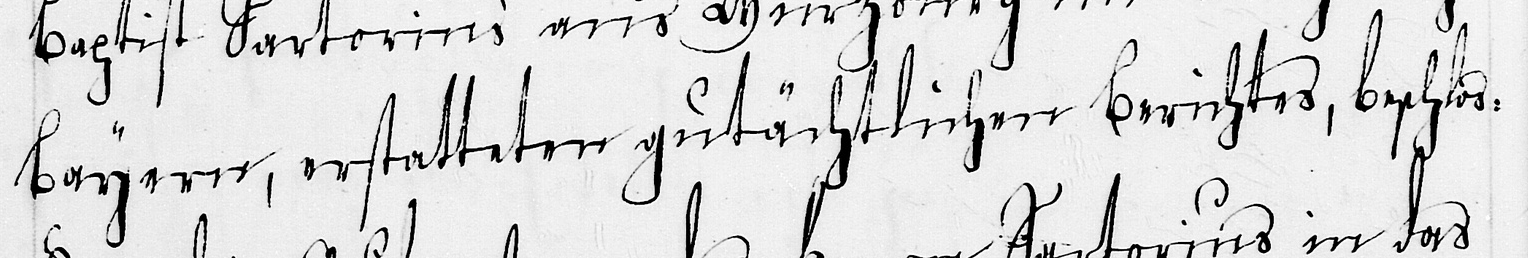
Bayern, erstattenen gutächtlichen Berichtes, beschlo¬
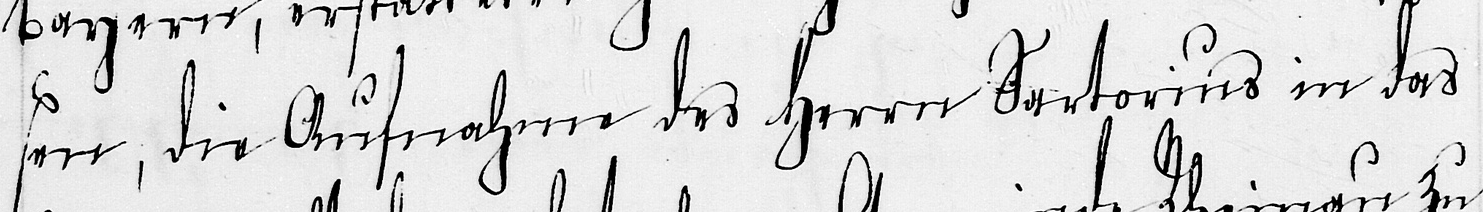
ßen, die Aufnahme des Herrn Sartorius in das
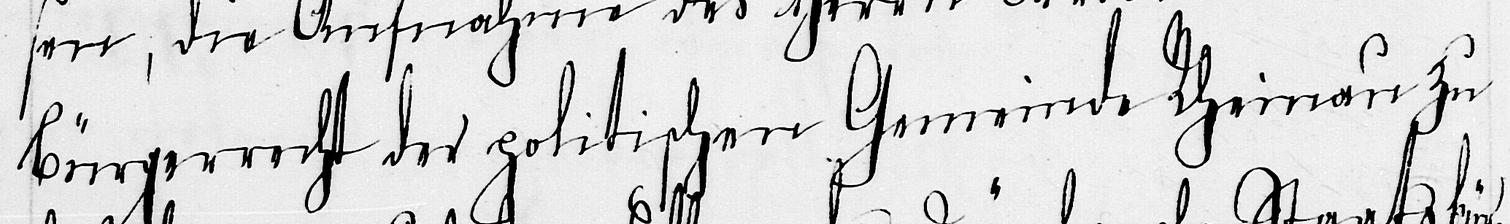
Bürgerrecht der politischen Gemeinde Rheinau zu
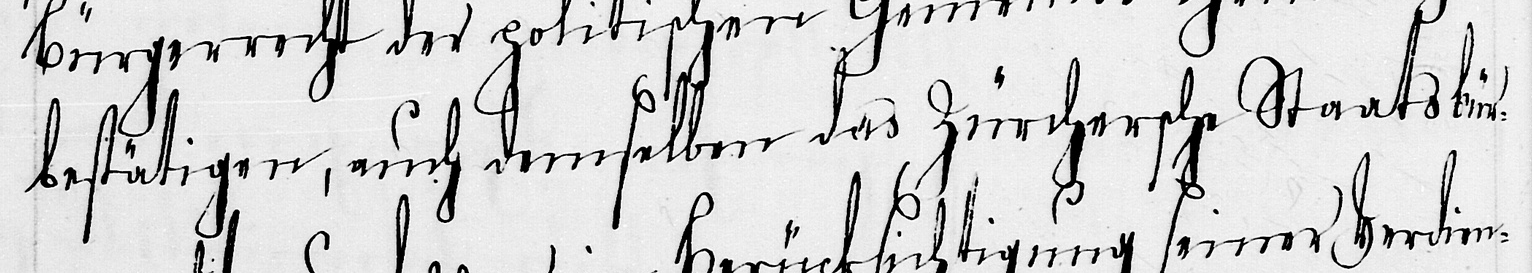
bestätigen, auch demselben das Zürchersche Staatsbü¬
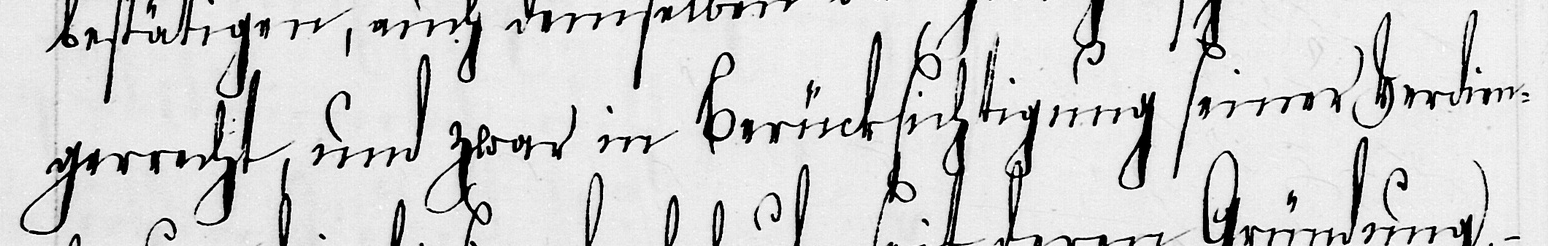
rgerrecht, und zwar in Berücksichtigung seiner Verdien¬
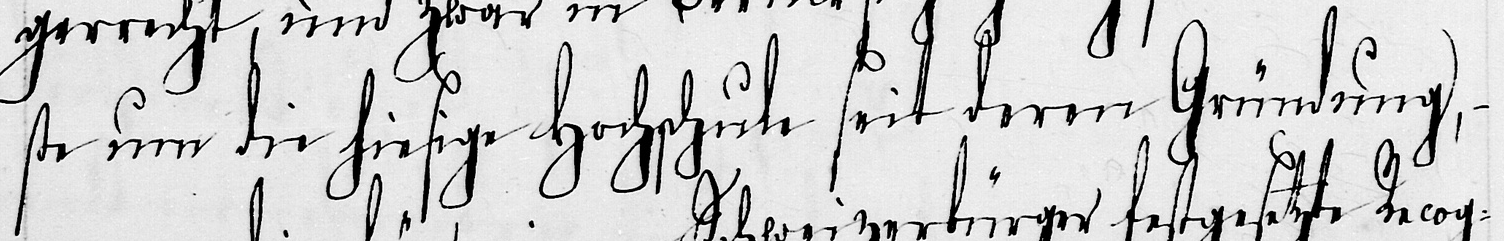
ste um die hiesige Hochschule seit deren Gründung,
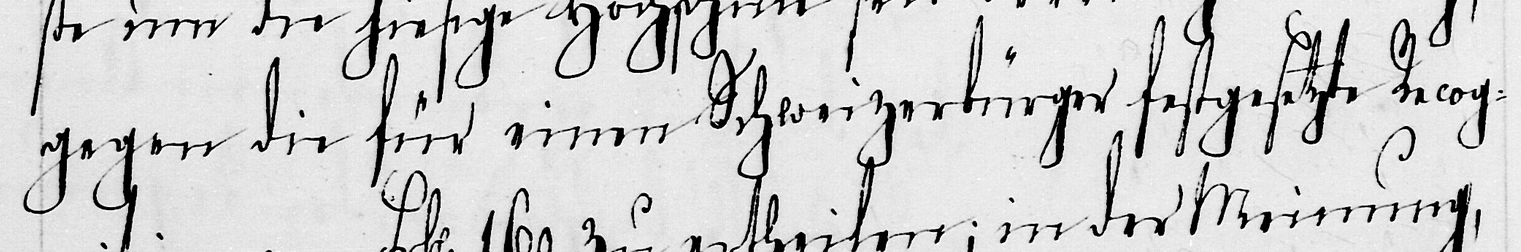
gegen die für einen Schweizerbürger festgesetzte Reco¬
